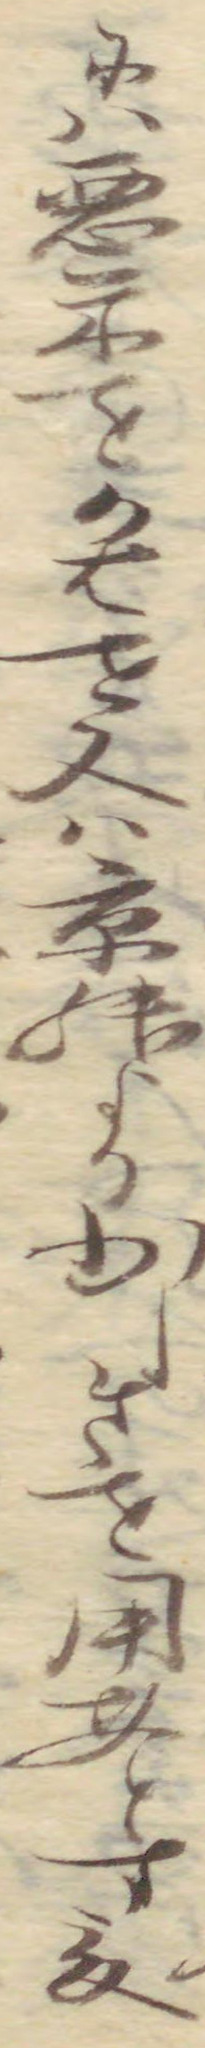には悪米をかはせ又は京升より少しきを用なとす爰
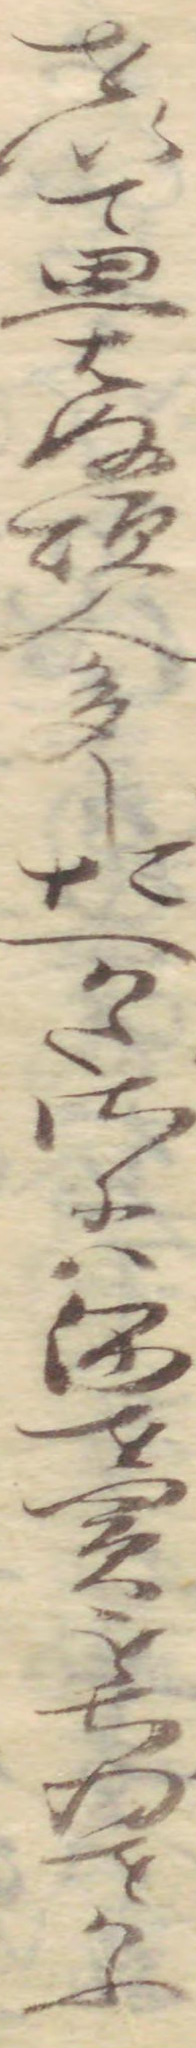を以て思はぬ煩人多したへかたさには酒を買もちゐをかふ
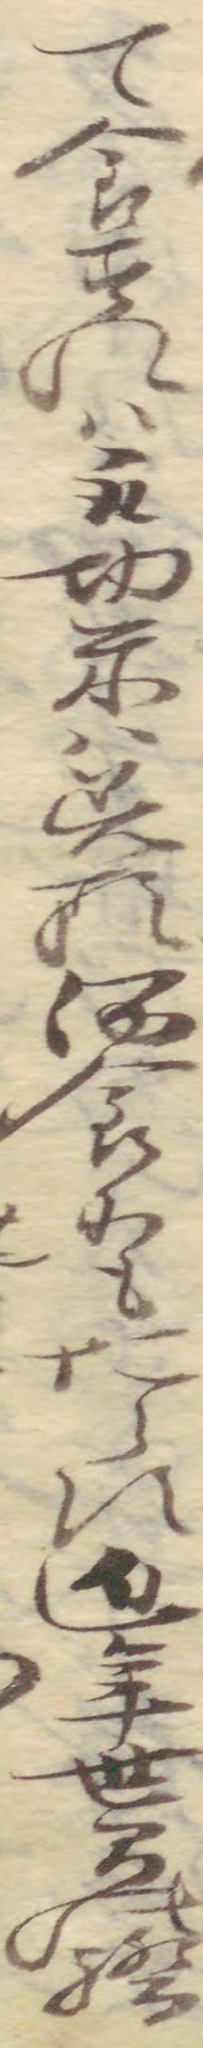て食すれは取切米は類酒食にもたらす近年世間の驕
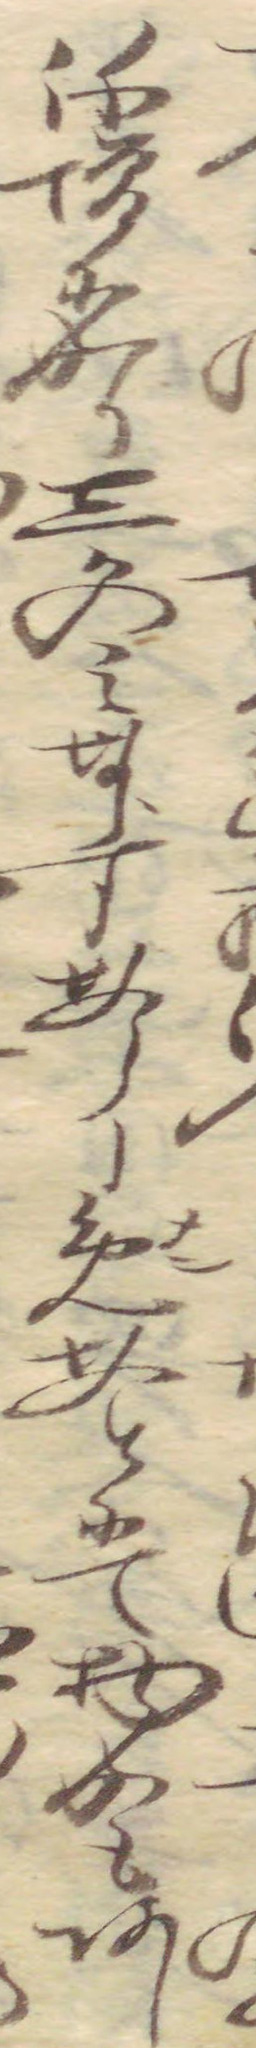弥増に成りしかのみならすならし免なとにて物成もあし
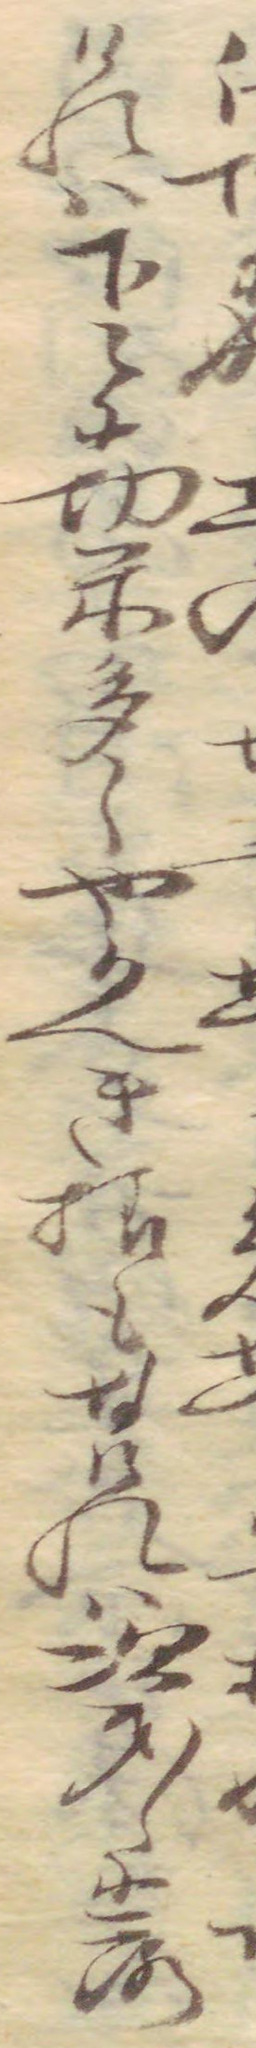けれは下〻に切米多くやるへき様もなけれは次第〳〵に落

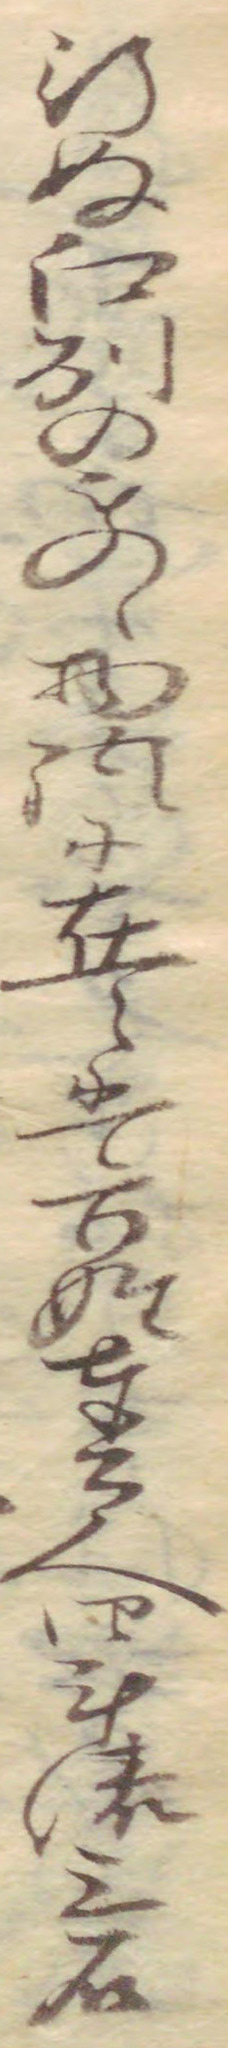行ぬ江州のものゝ物語に在〻にて百姓奉公人四斗俵三石
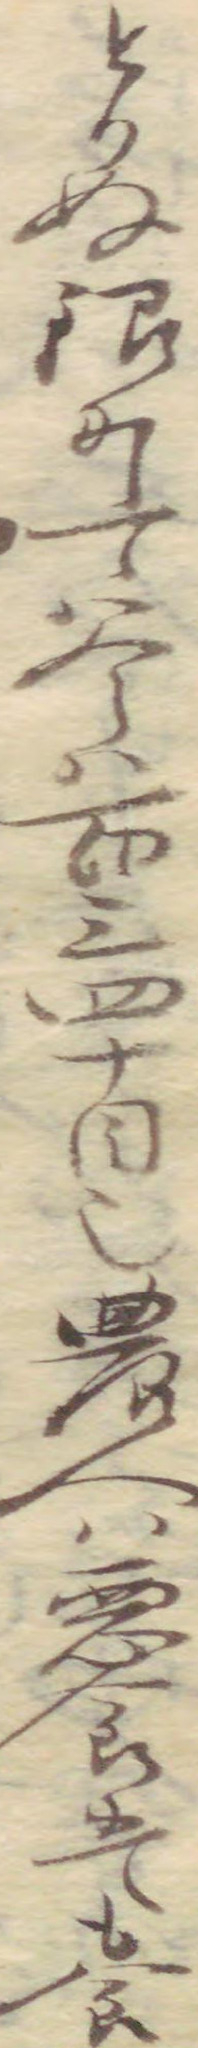とりぬ銀にしては今は百三四十目也農人は悪食にても食
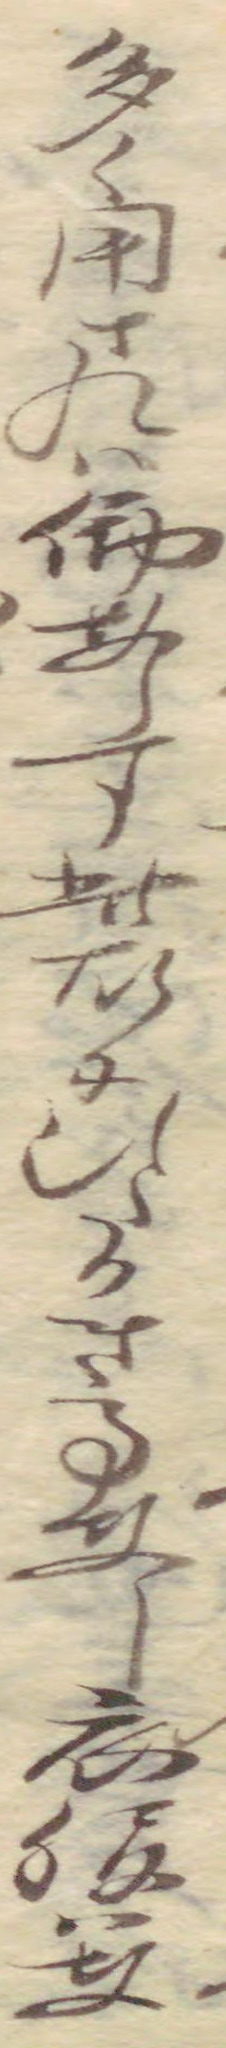多く用されは働ならす此故にひたるき事なし衣服はな
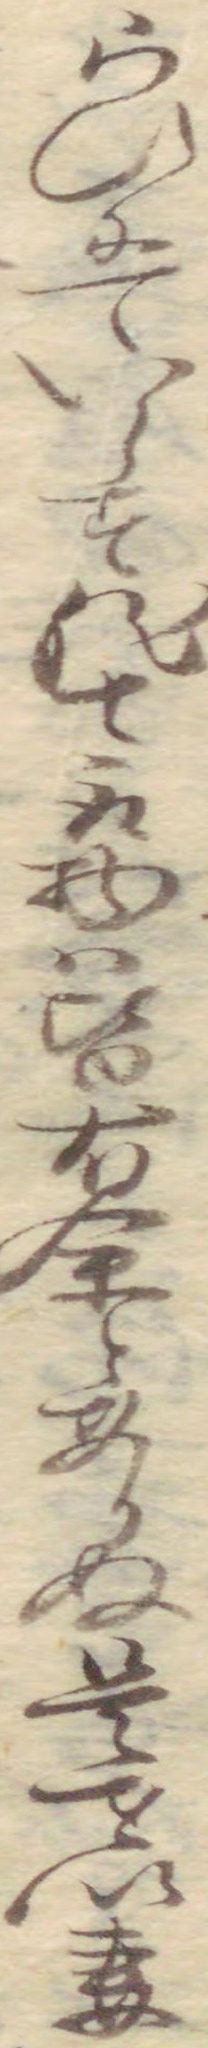らひにていらす然は取者は皆有余となりぬ是を以て妻
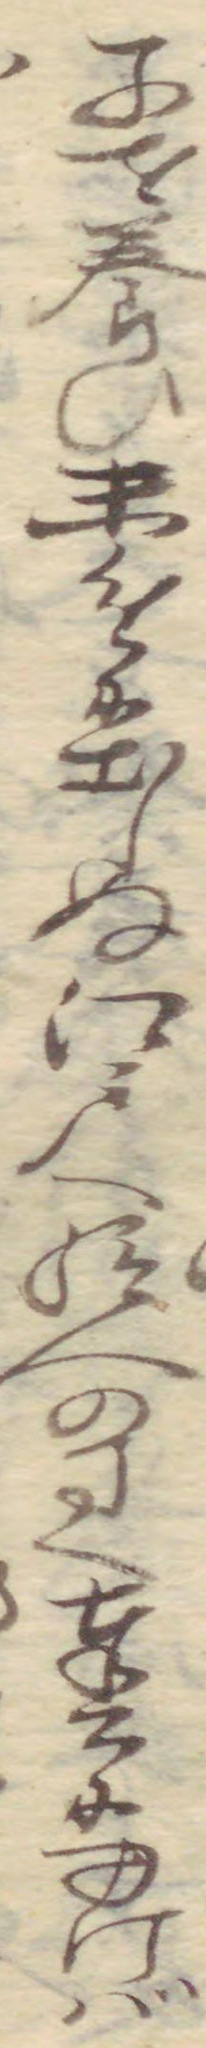子を養ひ未進に出しぬ江戸へ給人の方へ奉公にゆけば
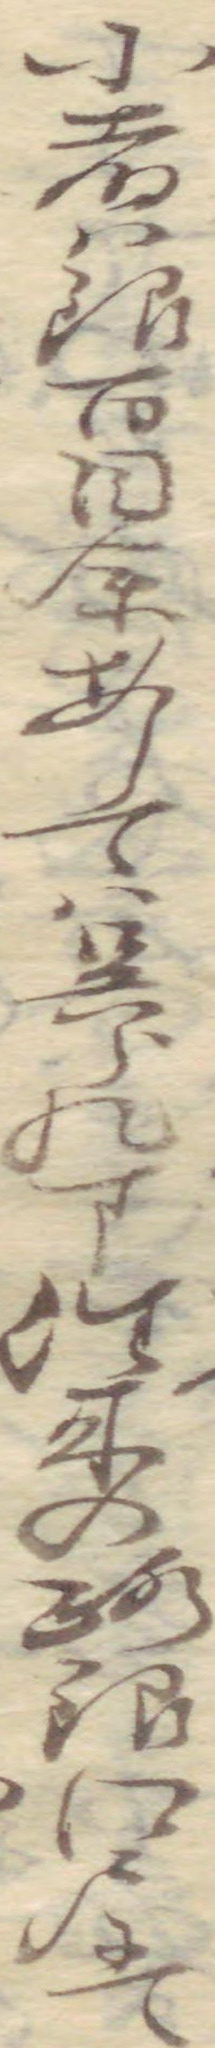小者は銀百目余ならては呉られす往来の路銀江戸にて
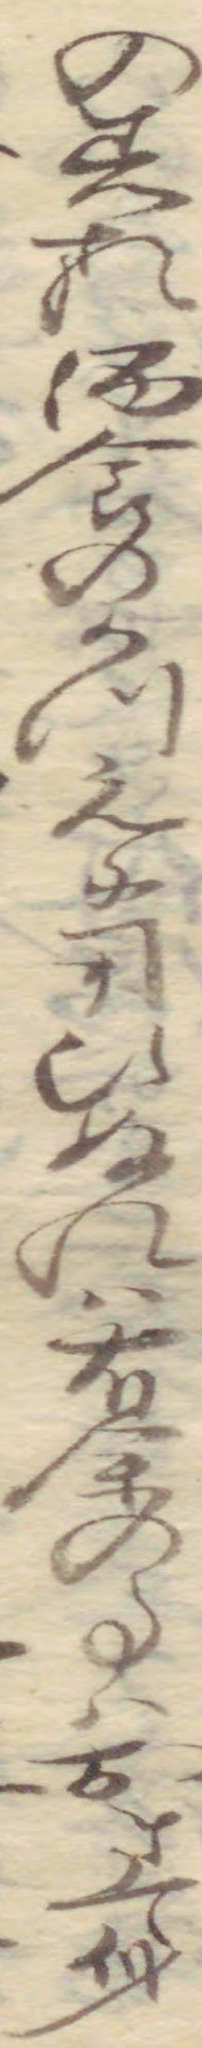の着類酒食のかつえに用ひぬれは有余の事はおきて身
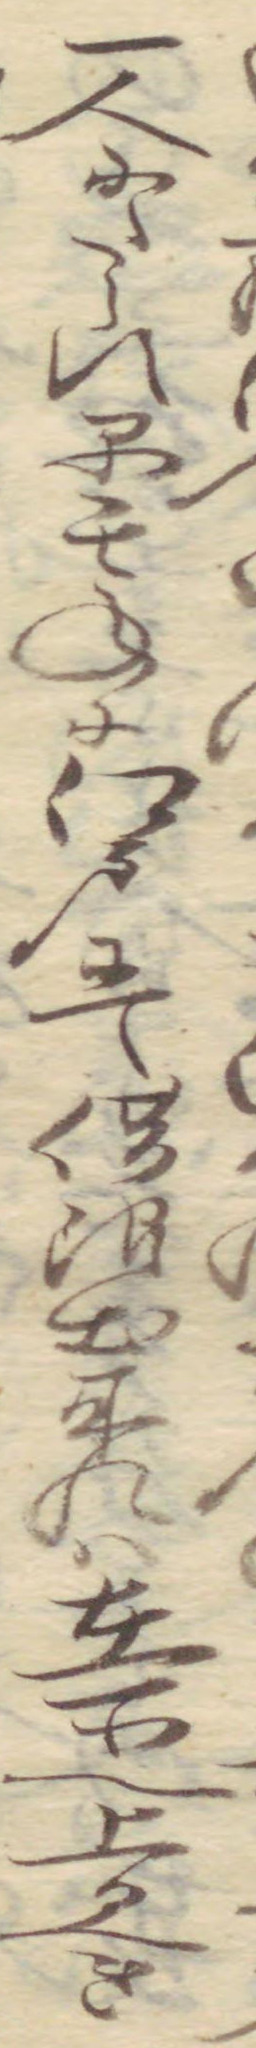一人にたらす早其年に江戸にて借銀出来れは在所へ上るへき
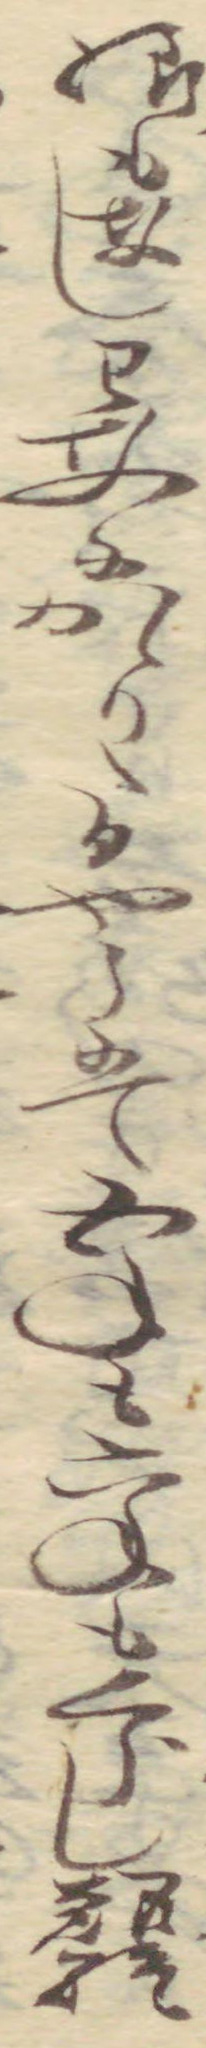様もなしわなにかゝりたるやうにて五年も六年もくらし艱難
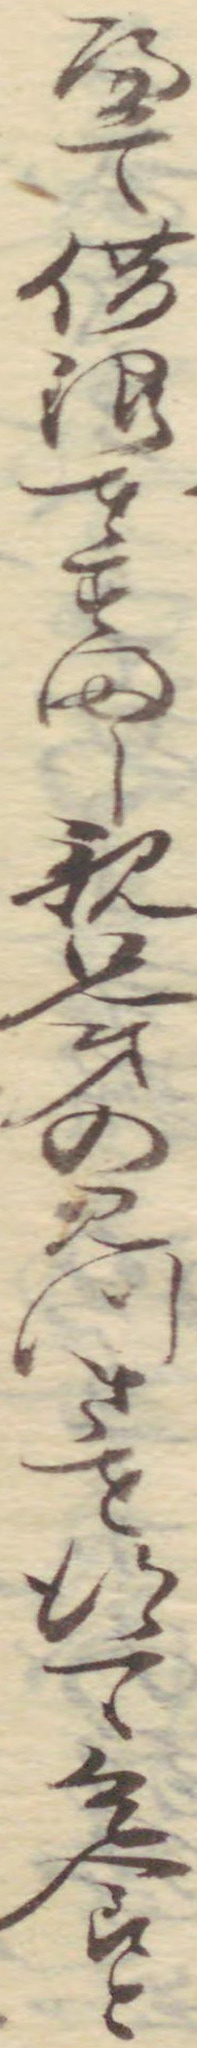へて借銀をすまし親兄弟のみつきを得て乞食と
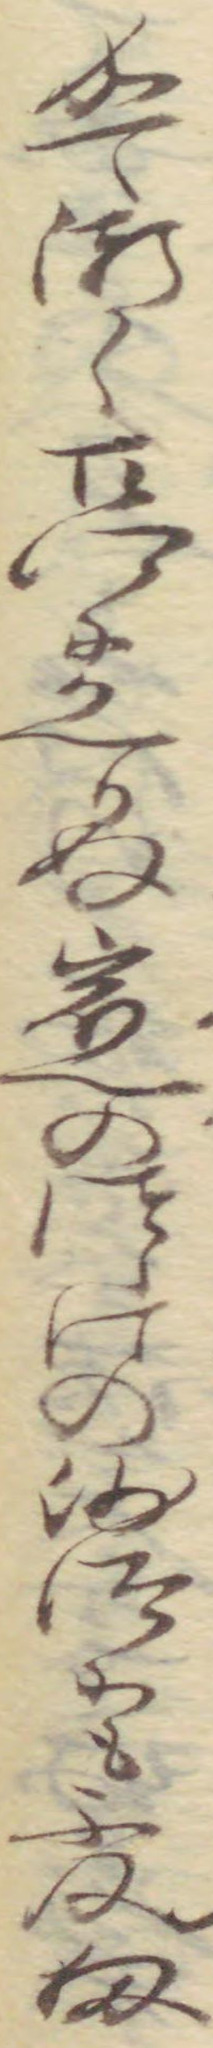成て漸く古郷にかへりぬ宿へのつゝけの沙汰にも不及扨
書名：鶯宿雑記. 巻263-264
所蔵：国立国会図書館 National Diet Library, JAPAN
